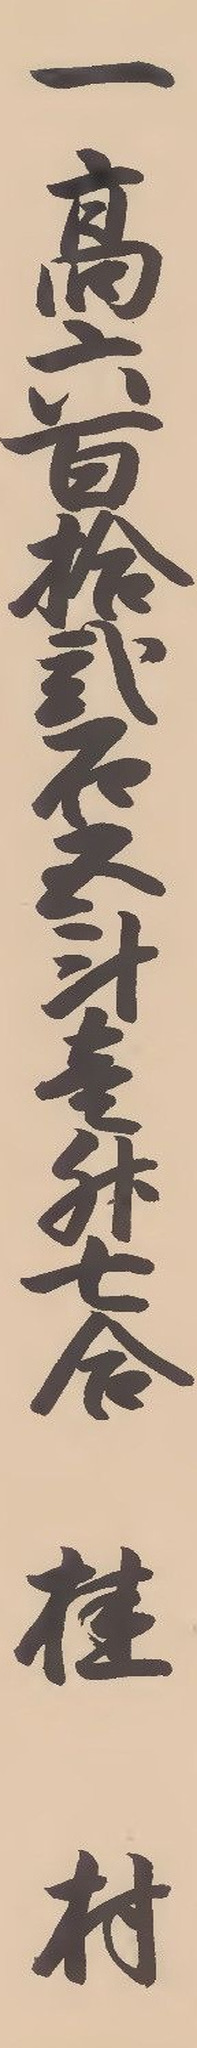一高六百拾弐石五斗壱升七合桂村
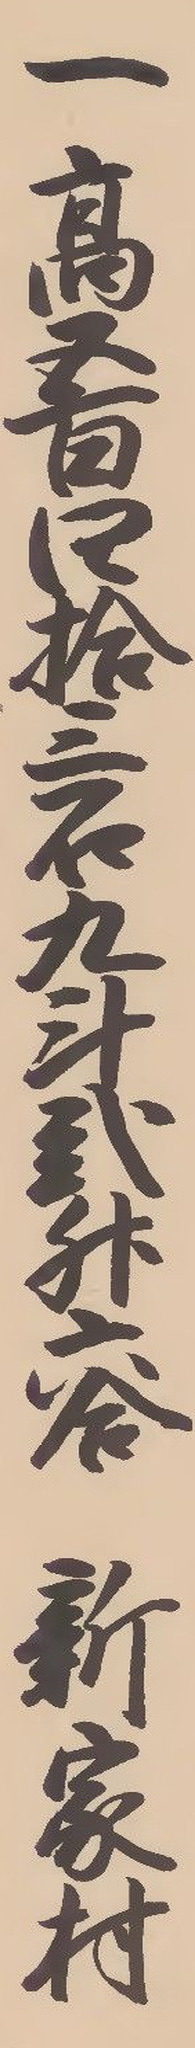一高五百四拾三石九斗弐升六合新家村

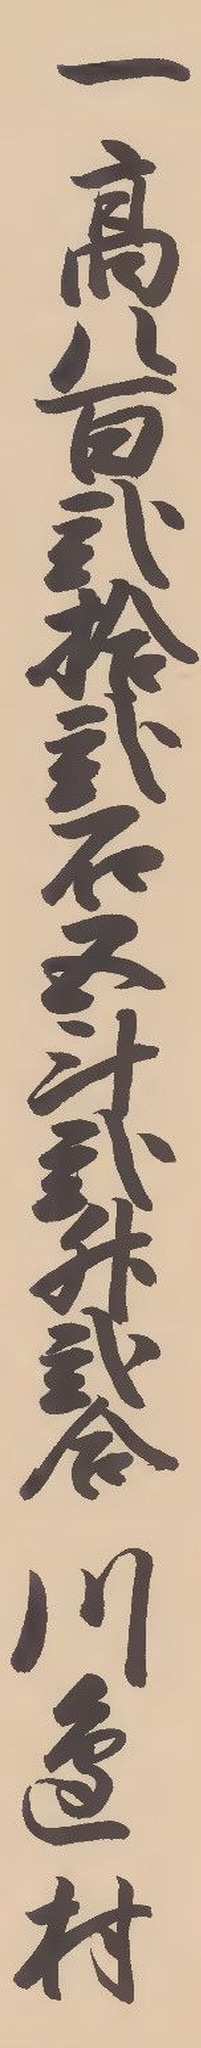一高八百弐拾弐石五斗弐升弐合川辺村
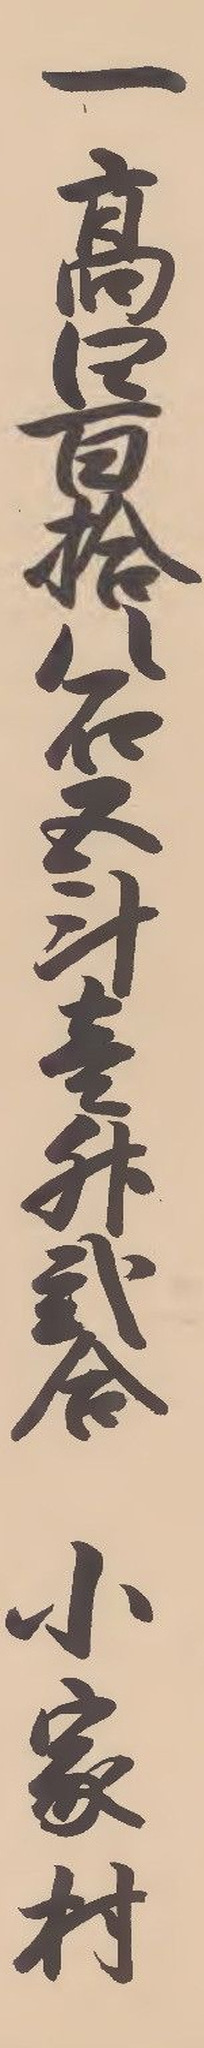一高四百拾八石五斗壱升弐合小家村
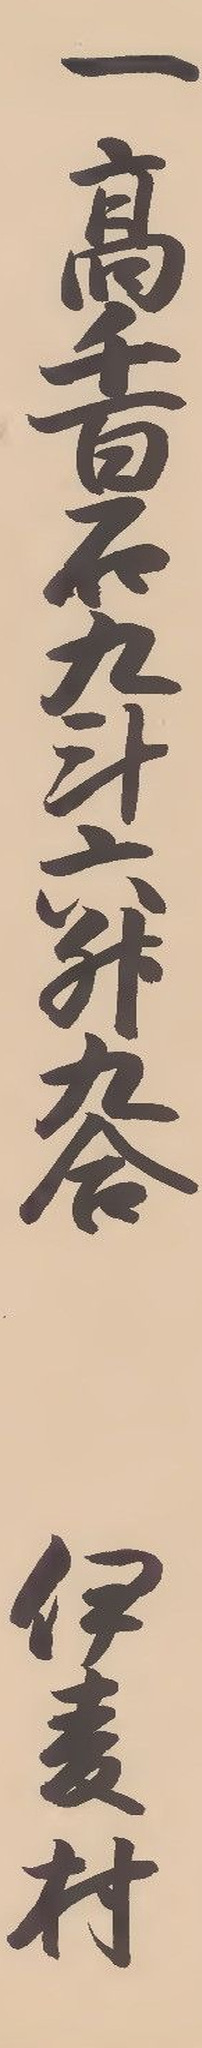一高千百石九斗六升九合伊麦村
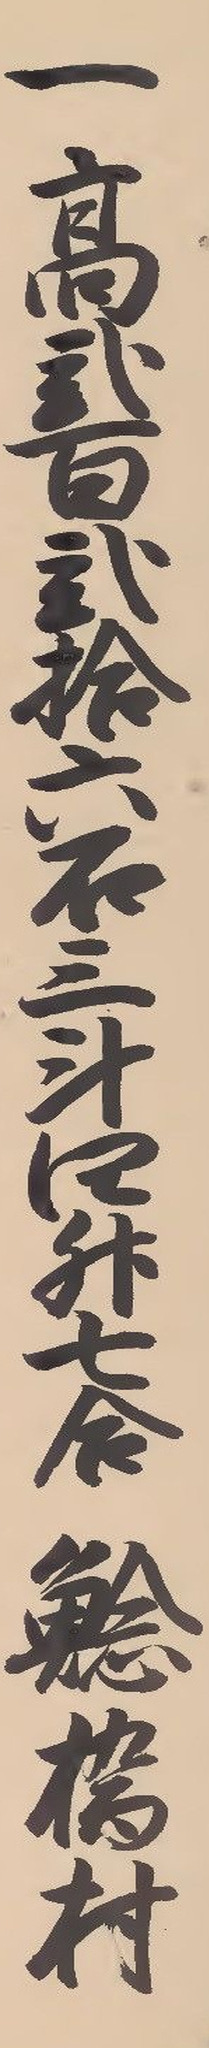一高弐百弐拾六石三斗四升七合鯰橋村
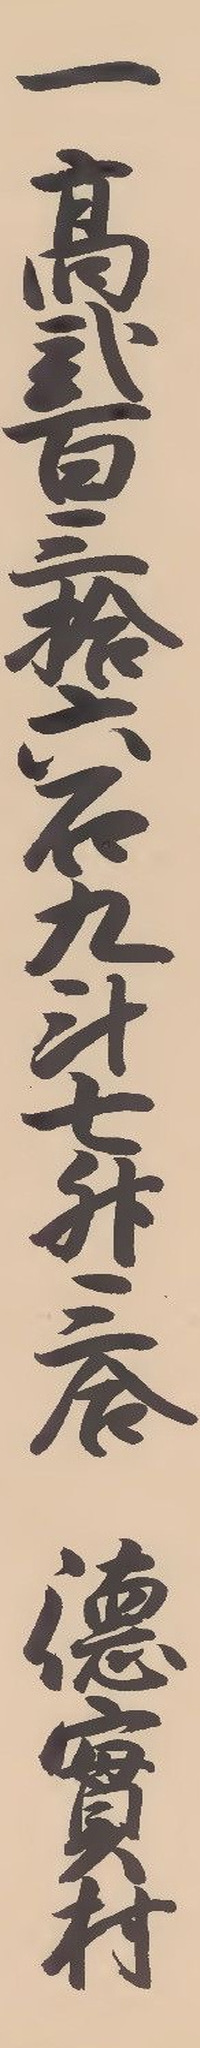一高弐百三拾六石九斗七升三合徳実村
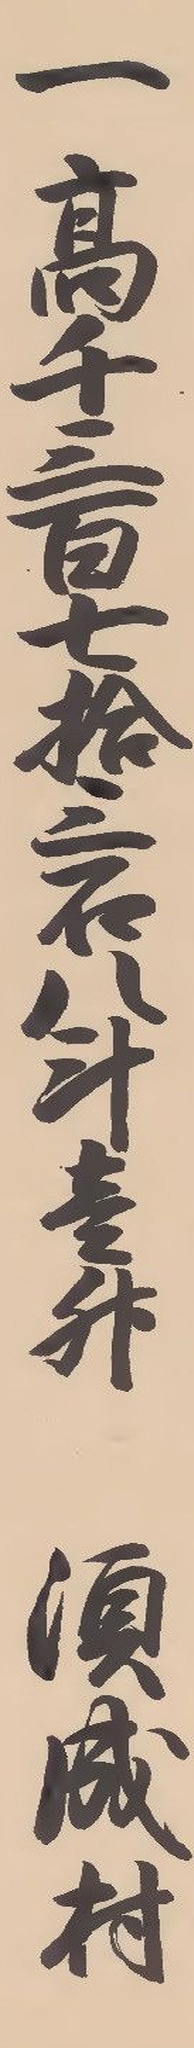一高千三百七拾三石八斗壱升須成村
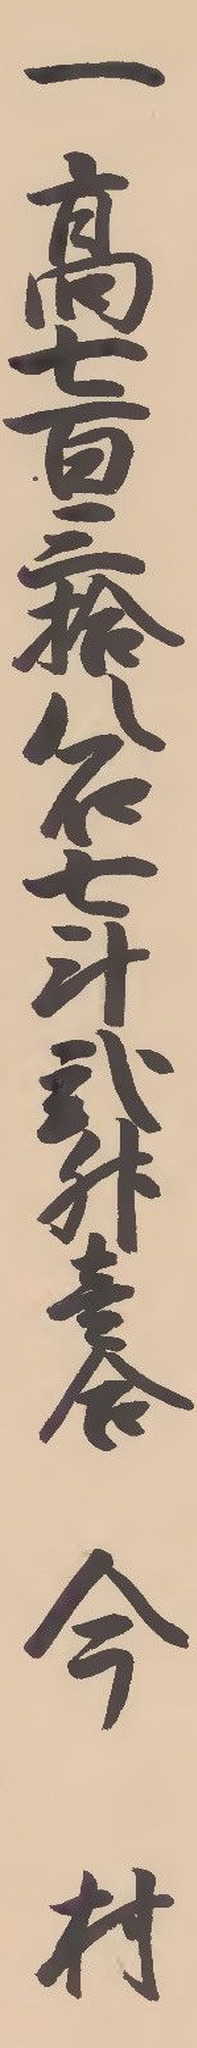一高七百三拾八石七斗弐升壱合今村

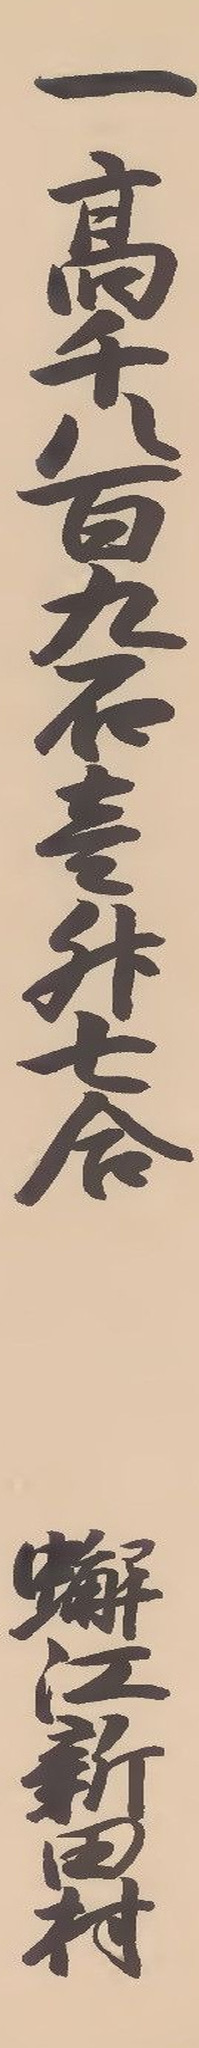一高千八百九石壱升七合蠏江新田村
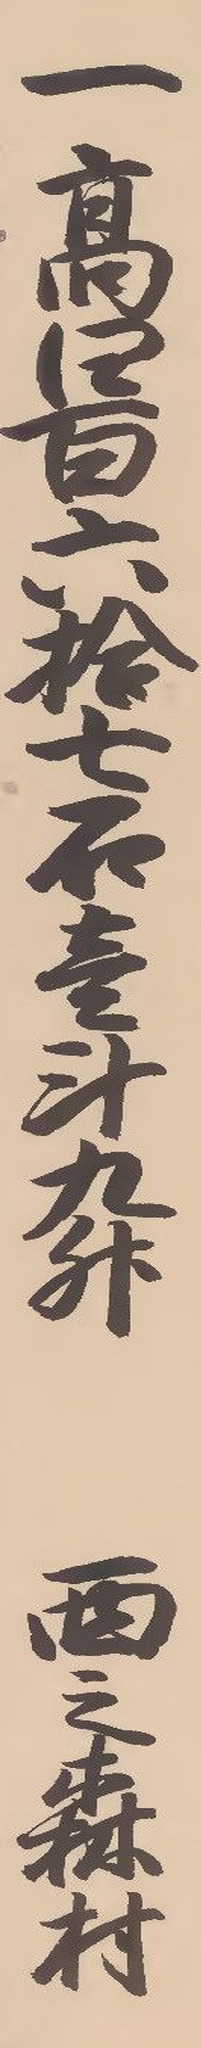一高四百六拾七石壱斗九升西之森村
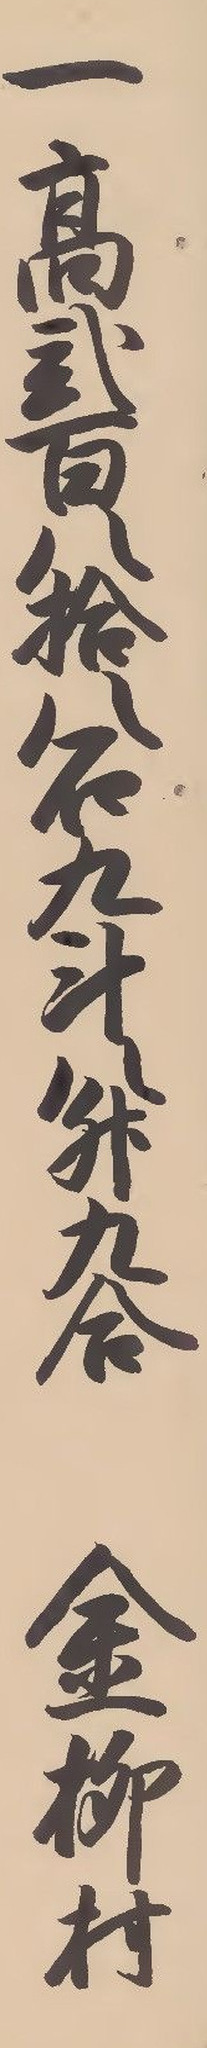一高弐百八拾八石九斗八升九合金柳村
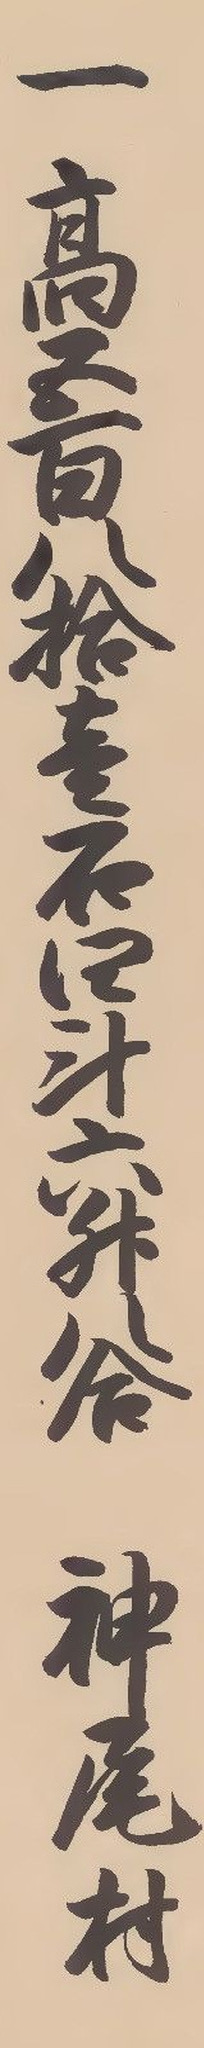一高五百八拾壱石四斗六升八合神尾村
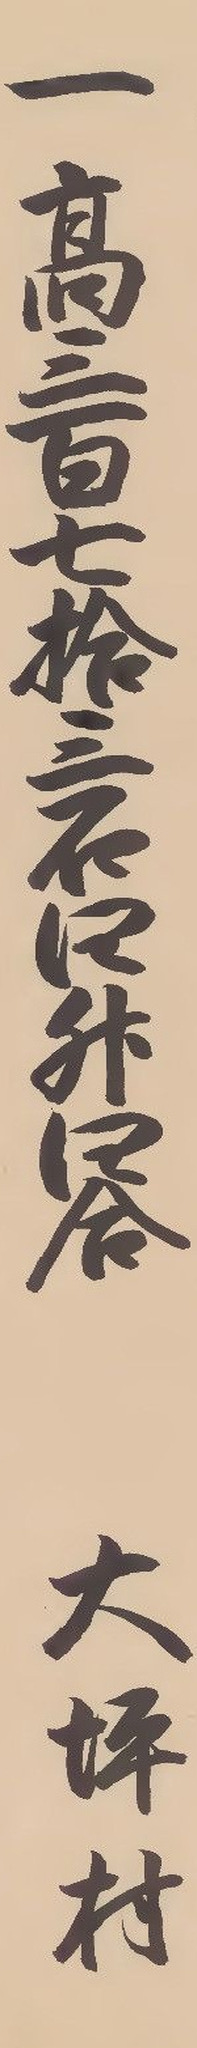一高三百七拾三石四升四合大坪村
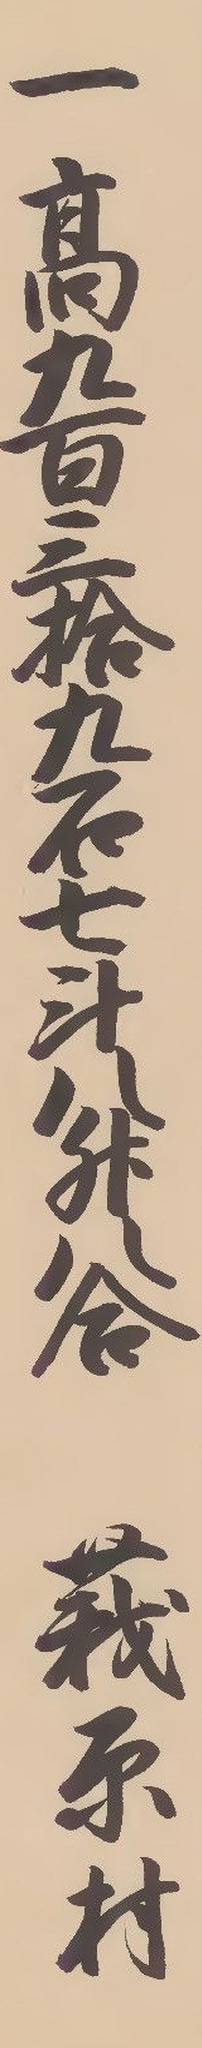一高九百三拾九石七斗八升八合莪原村

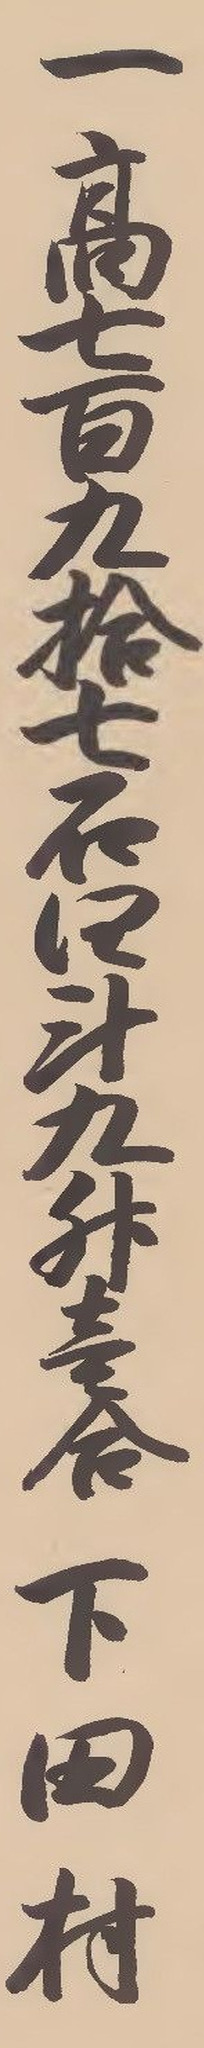一高七百九拾七石四斗九升壱合下田村
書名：尾張国郷帳
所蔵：国立公文書館 National Archives of Japan
